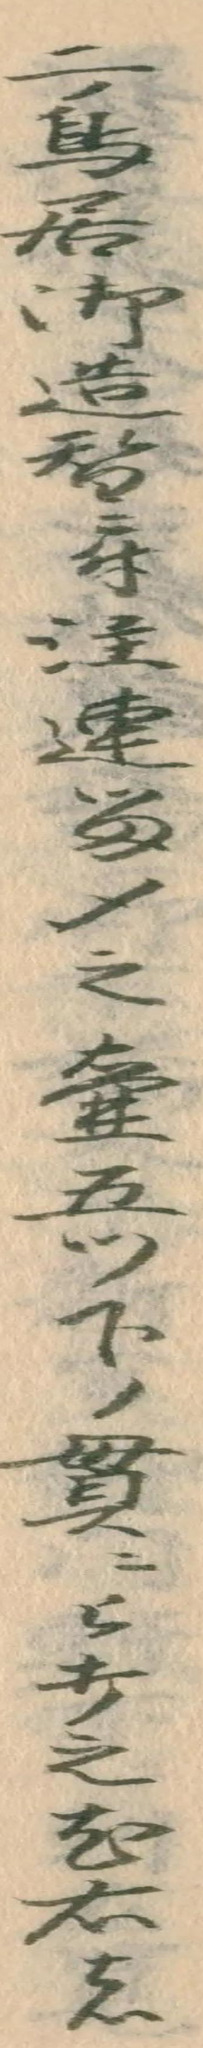一二ノ鳥居御造替ニ付注連留〆之壺五ツ下ノ貫ニ被打之尤右は
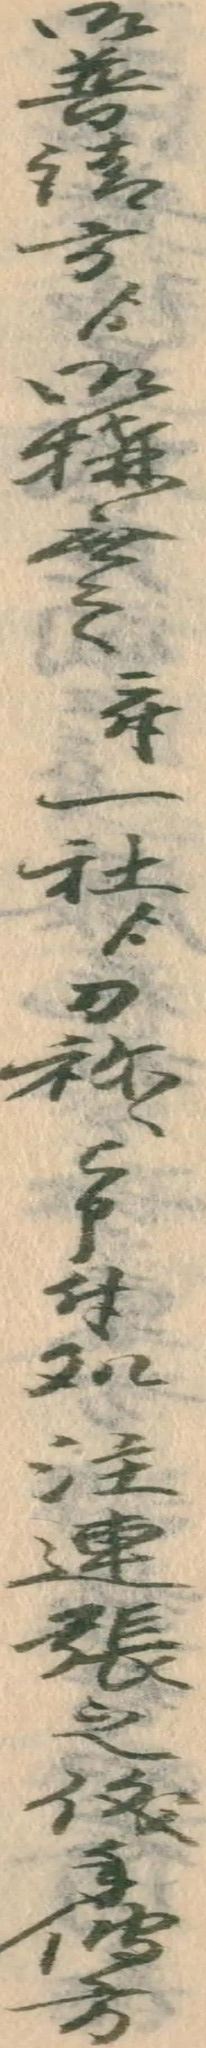御普請方ゟ御構無之ニ付一社ゟ刀祢へ被申付処注連張之儀手伝方
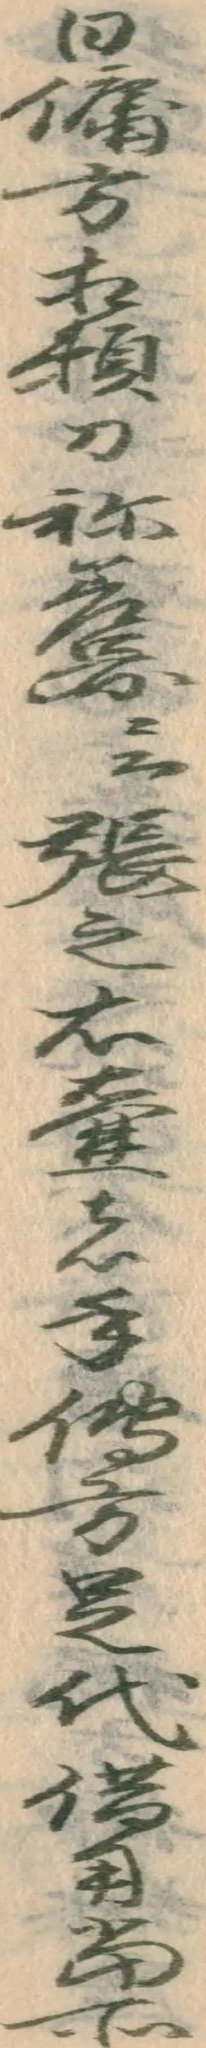日傭方相頼刀祢差図ニ而張之右壺は手伝方足代借用当所
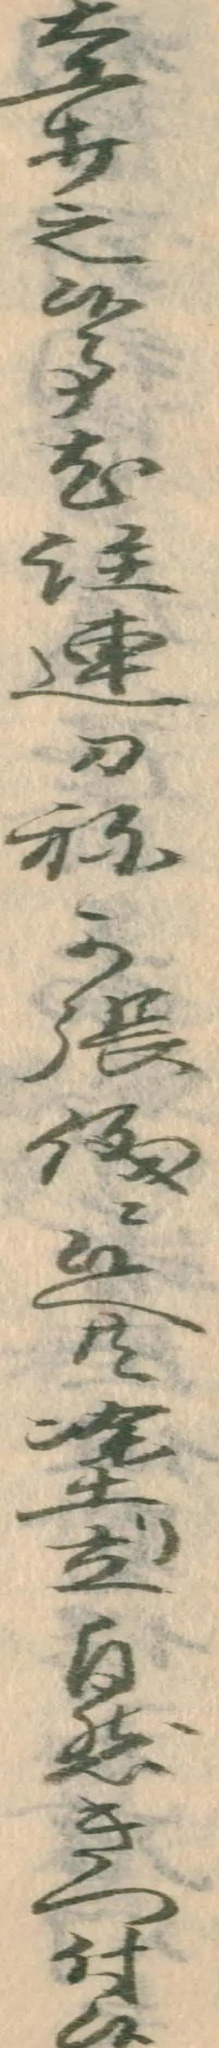大工打之候事尤注連刀祢可張儀ニ候へ共塗り立自然きつ付候
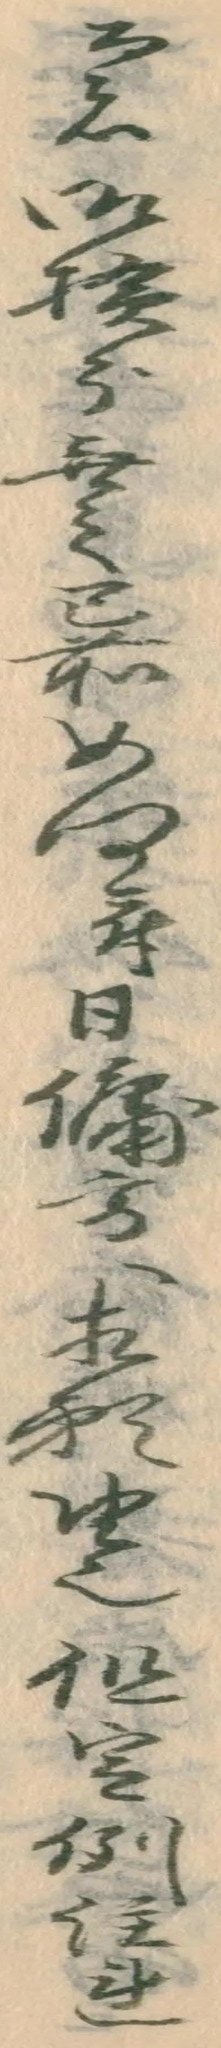而は御検分無之已前如何ニ付日傭方へ相願由也但定例注連
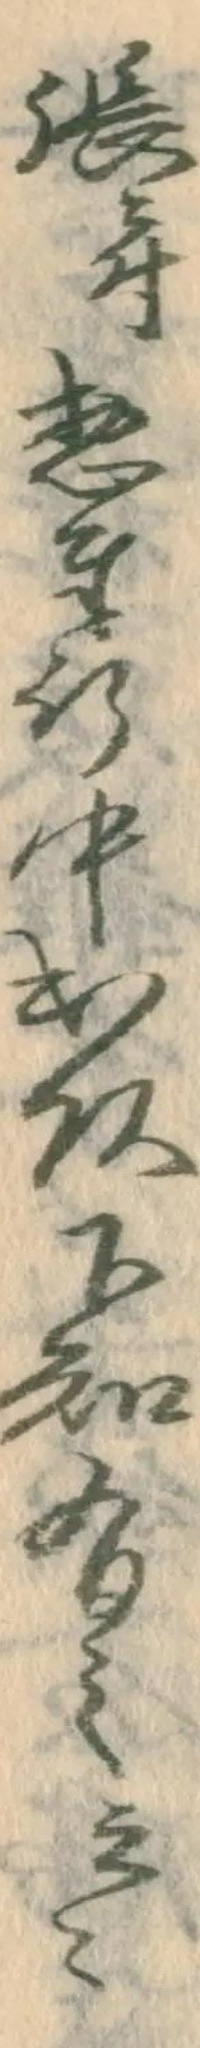帳ニ付惣奉行中出頭下知有之云々
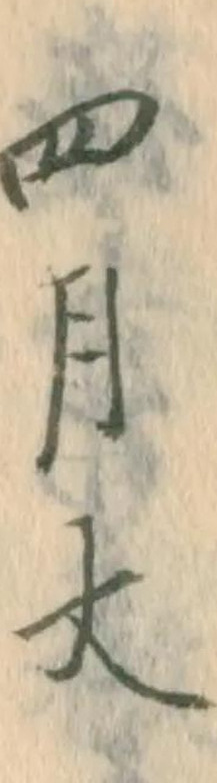四月大
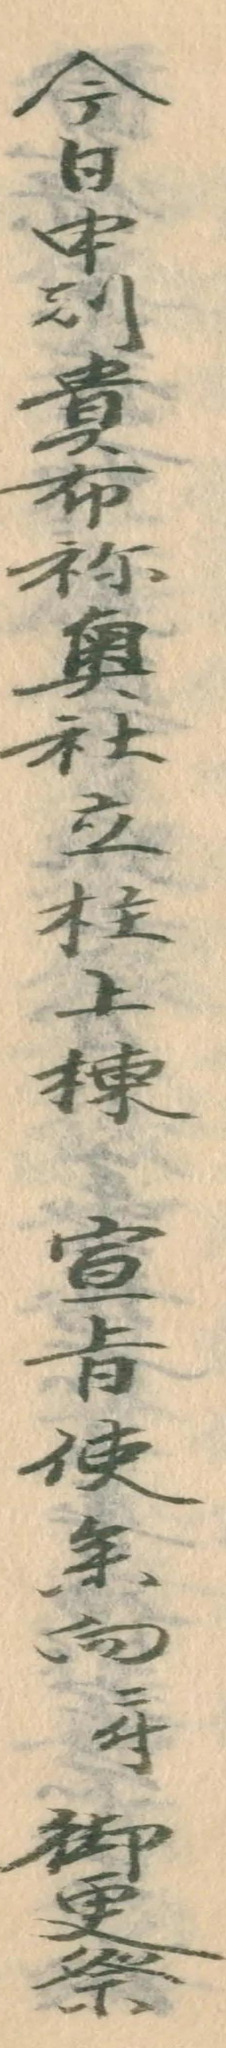一今日申刻貴布祢奥社立柱上棟宣旨使参向ニ付御更祭
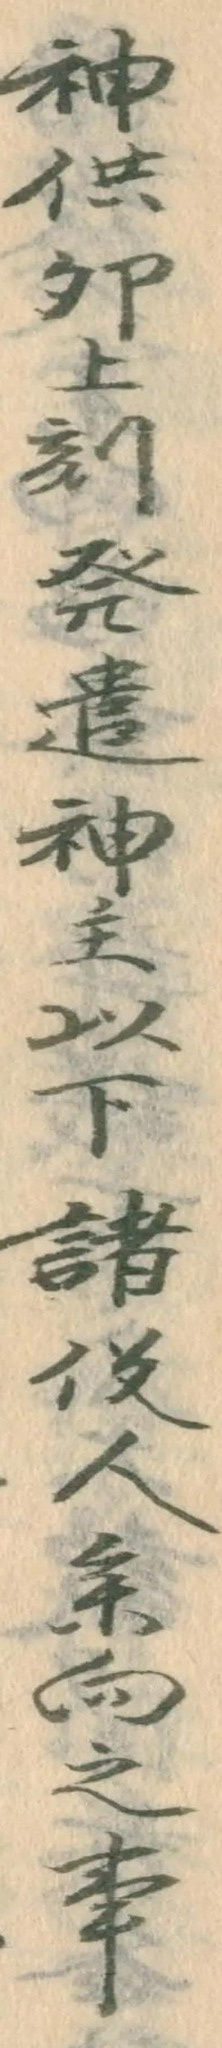神供卯上刻発遣神主以下諸役人参向之事

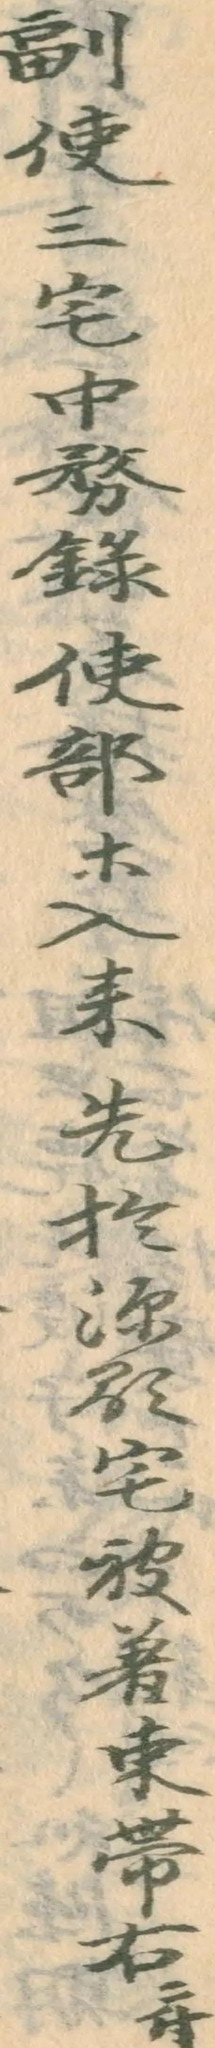副使三宅中務録使部等入来先於源顕宅被着束帯右ニ付
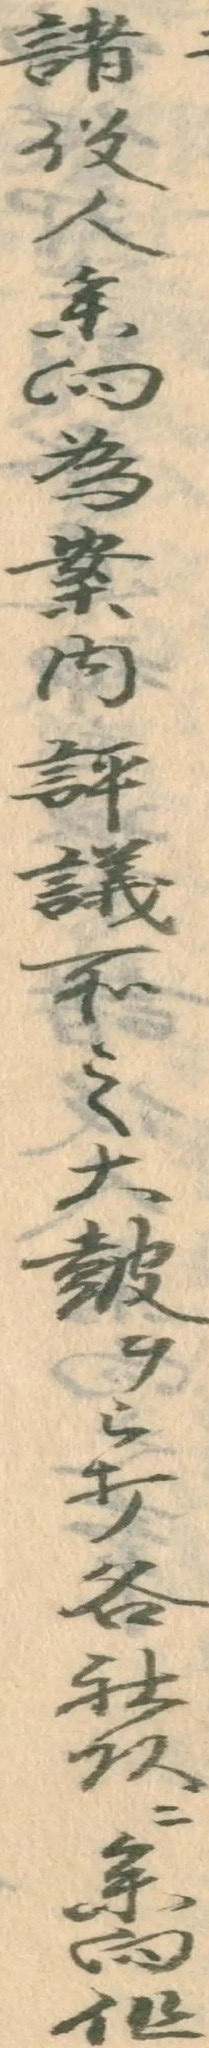諸役人参向為案内評議所之大鼓ヲ被打各社頭ニ参向但
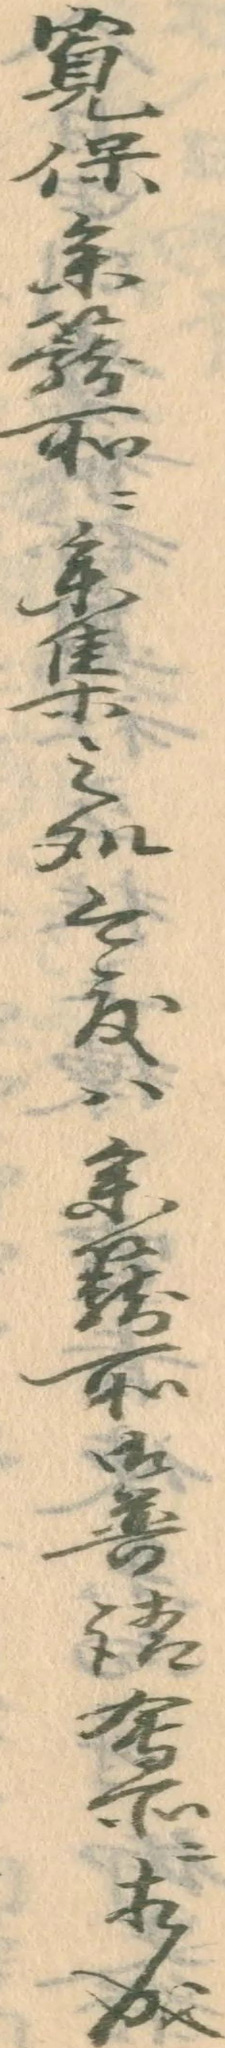寛保参籠所ニ参集之処今度ハ参籠所御普請会所ニ相成
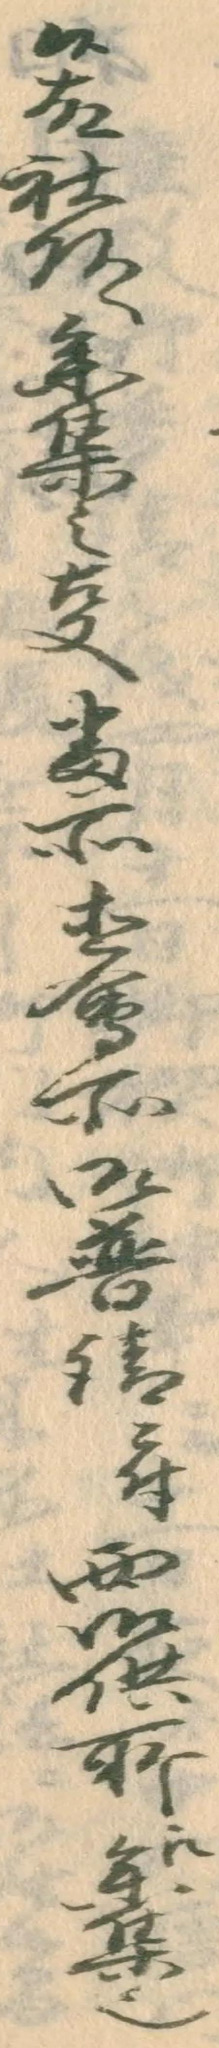候故社頭へ参集之事番所直会所御普請ニ付西御供所江参集也
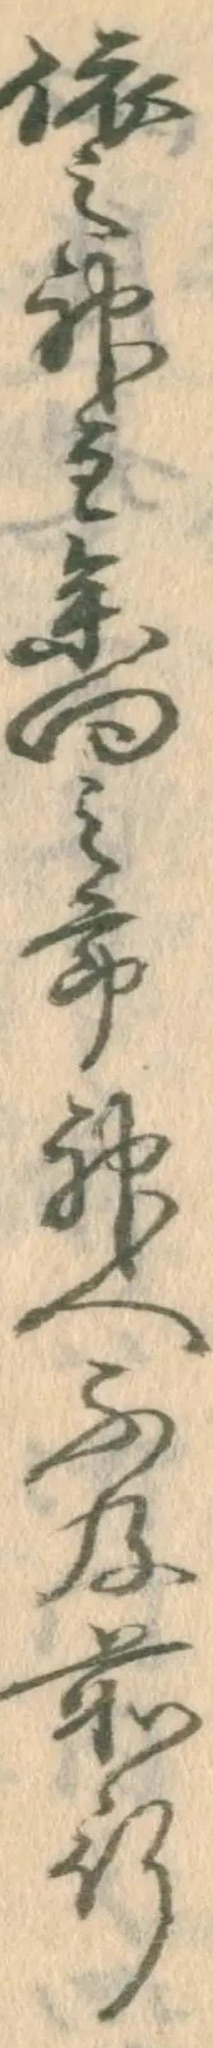依之神主参向之節神人不及前行
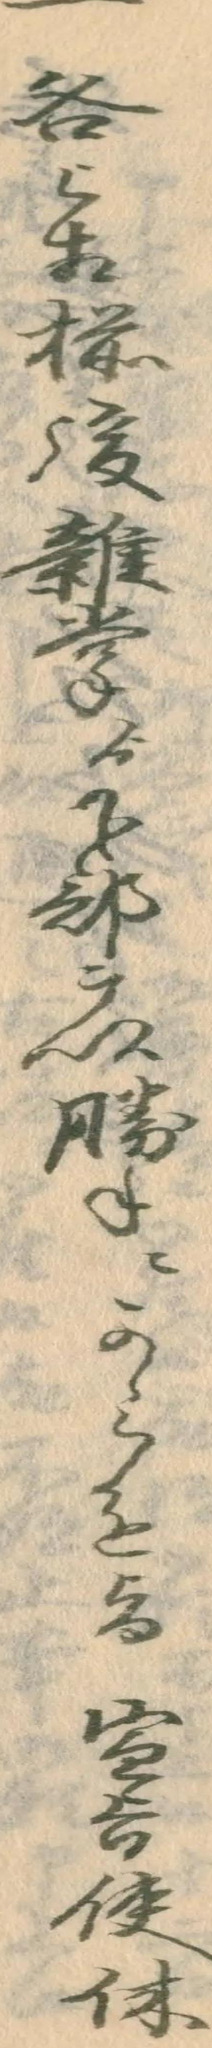一各被相揃後雑掌ゟ下部ヲ以勝手ニ可三進旨宣旨使休
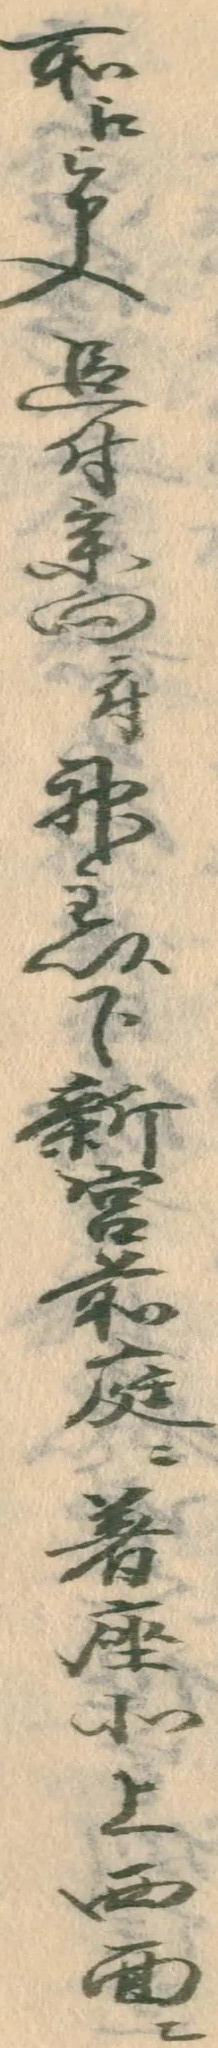所江被申入追付参向ニ付神主以下新宮前庭ニ着座北上西面ニ
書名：賀茂社記録. 第17冊
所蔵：国立国会図書館 National Diet Library, JAPAN
